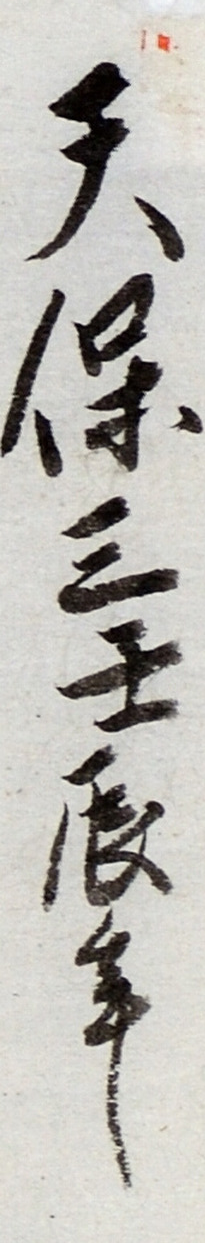天保三壬辰年
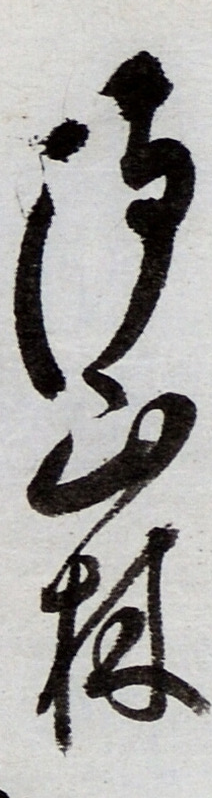御山林
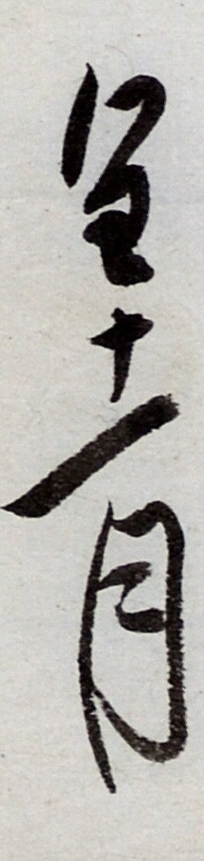閏十一月
